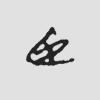臣
